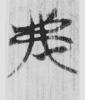弗
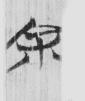余
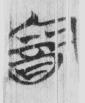酓
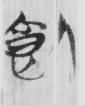飤
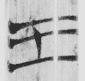王
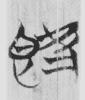旣
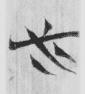必
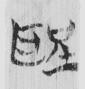聖
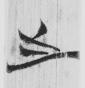之
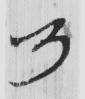乃
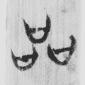品
